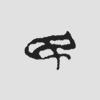民
